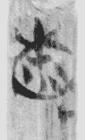本B（本）
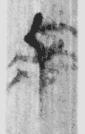手
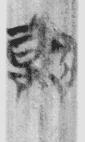則
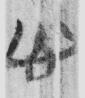心
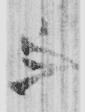之
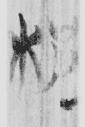枳
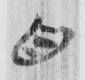目
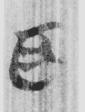耳
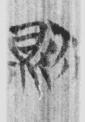則
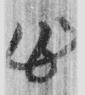心
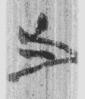之
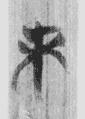末
